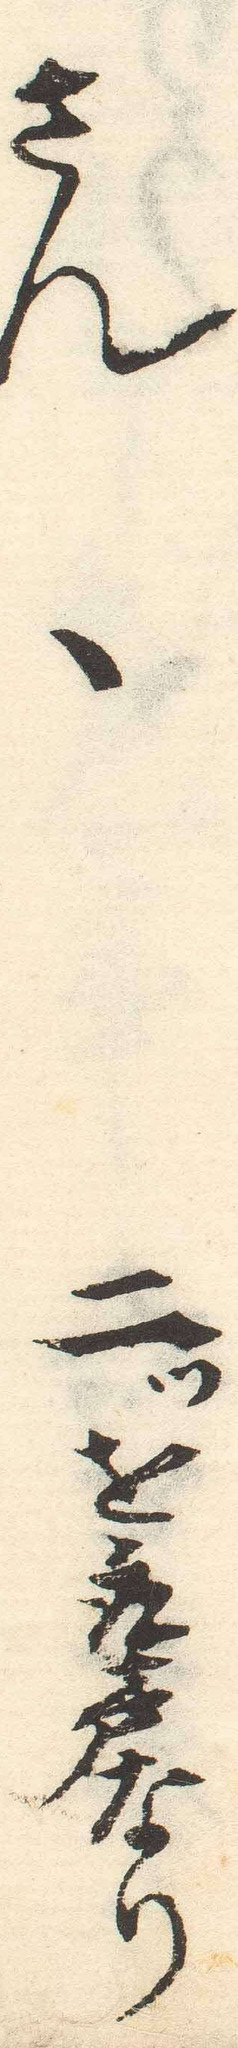さんヽ二ッを取声なり

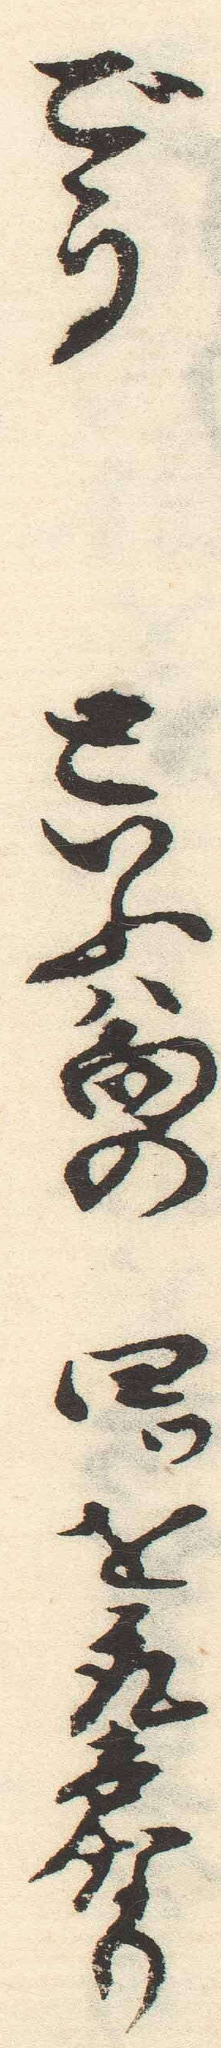ごうといふは向の四ッを取声なり
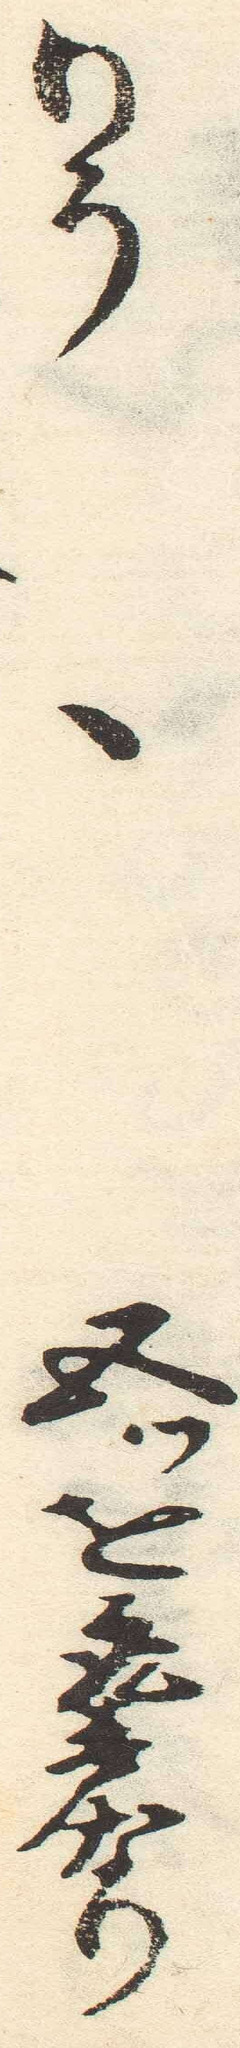りうヽ五ッを取声なり
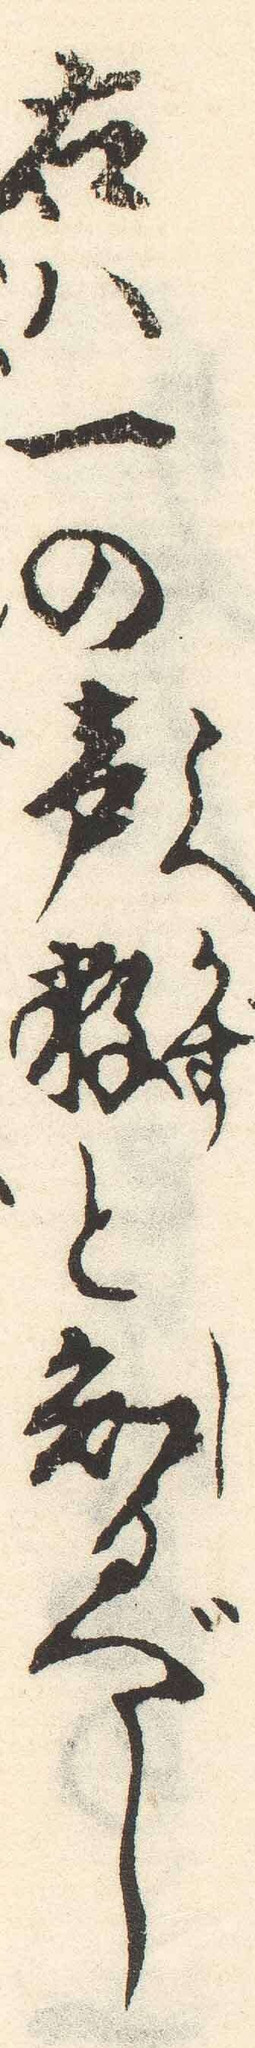右は一の声数と知るべし
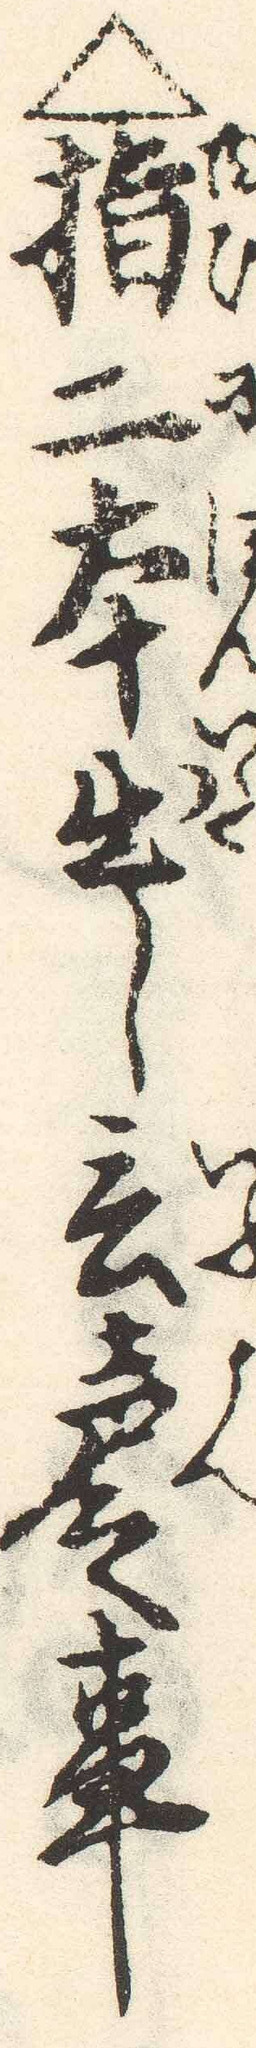△指二本出し云声之事
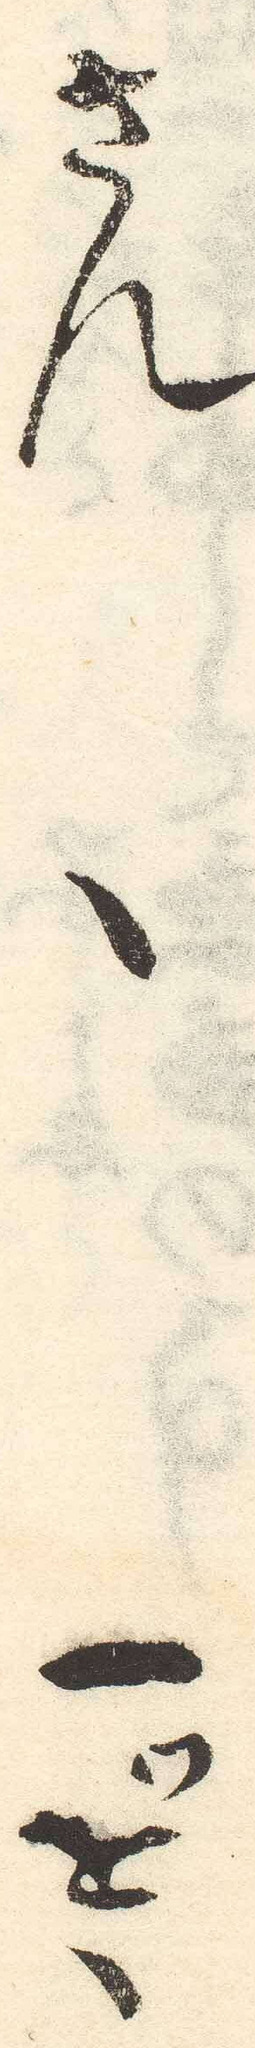さんヽ一ッをヽ
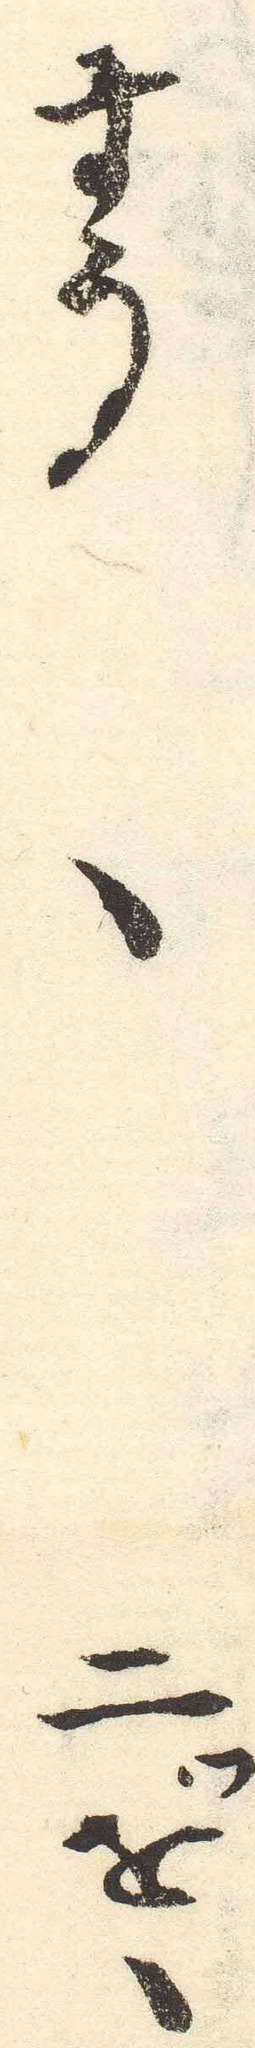すうヽ二ッをヽ
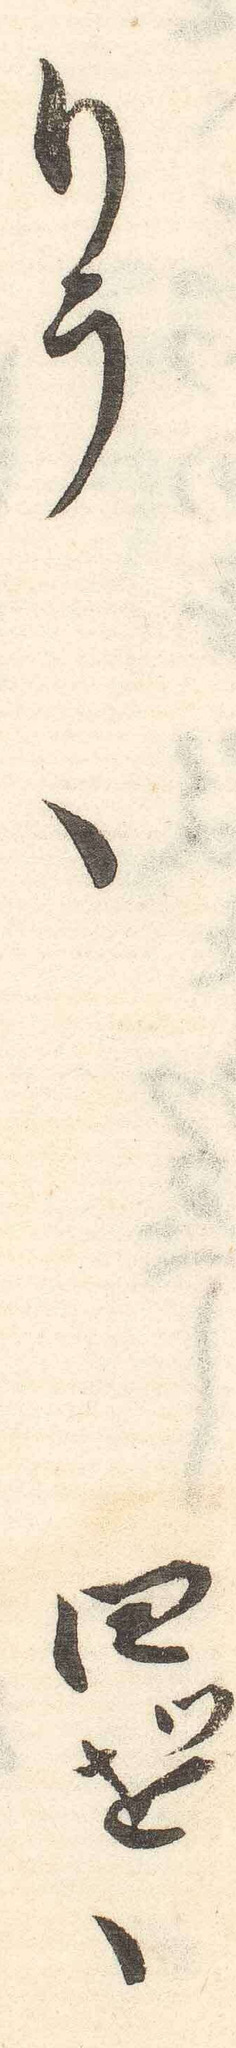りうヽ四ッをヽ
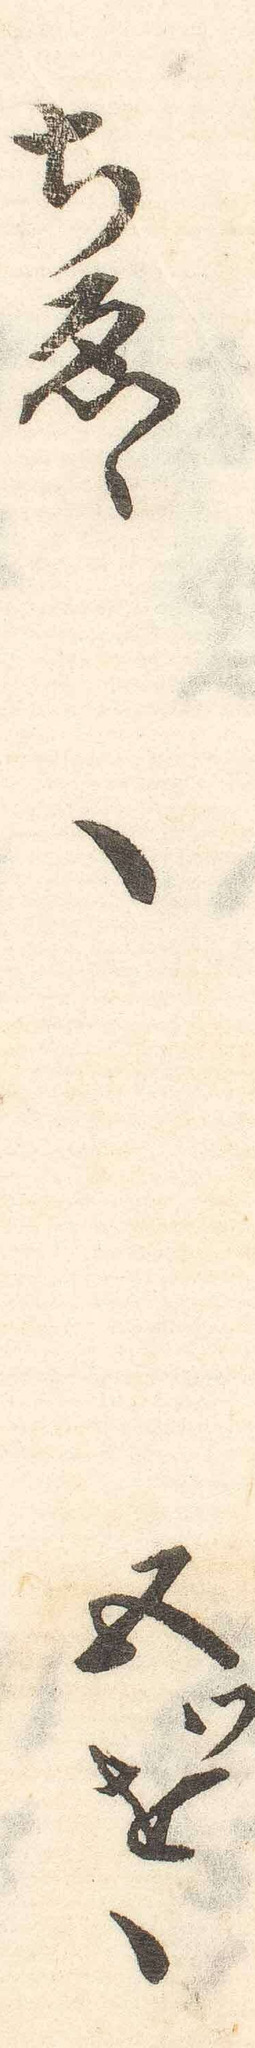ちゑゝヽ五ッをヽ
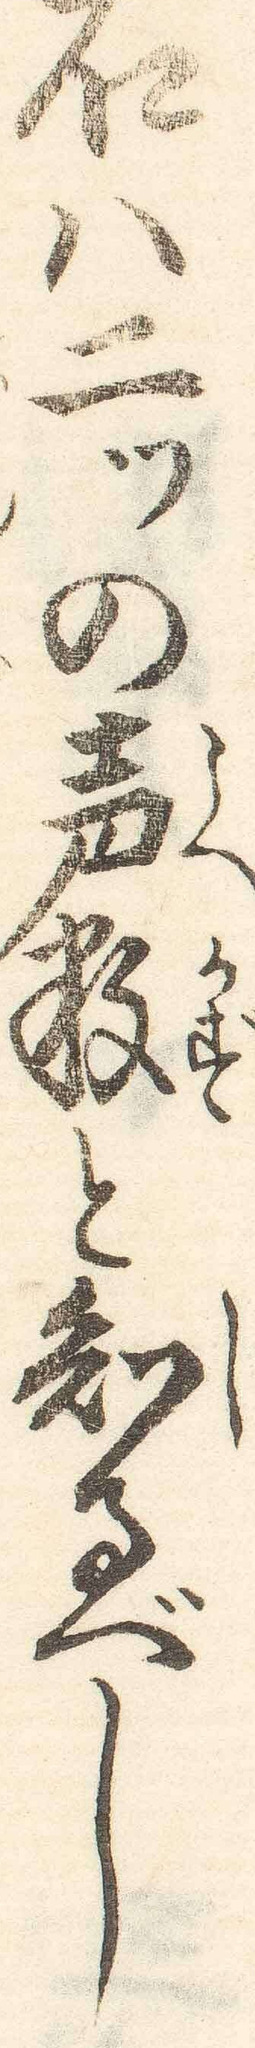右は二ッの声数と知るべし
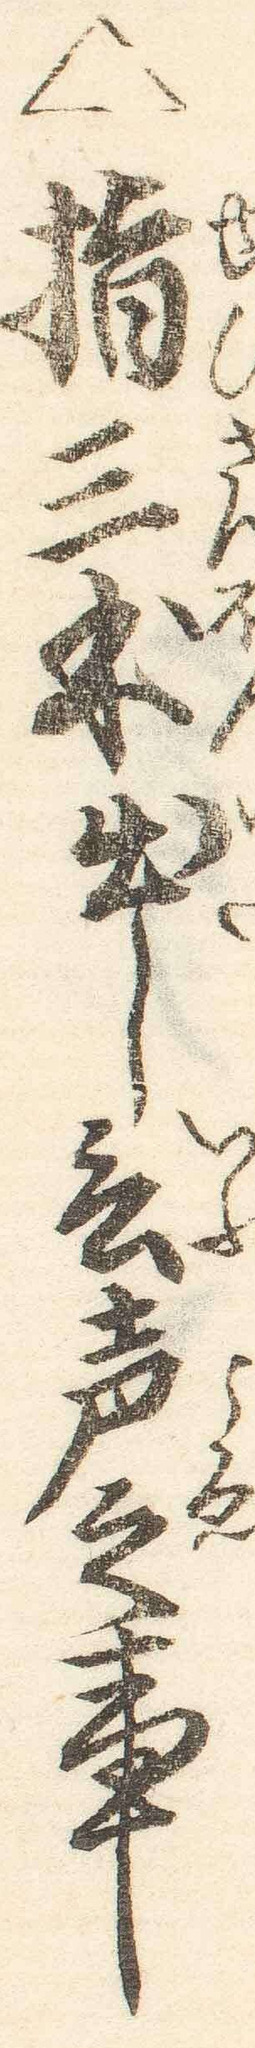△指三本出し云声之事

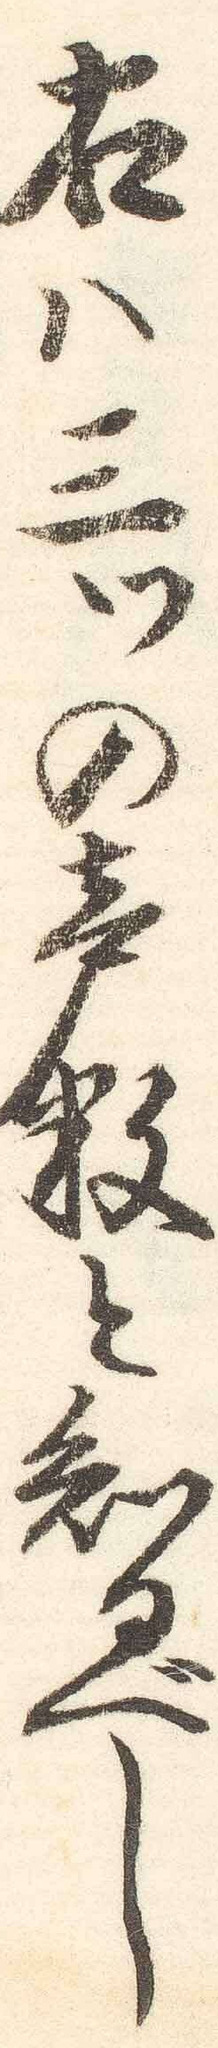右は三ッの声数と知るべし
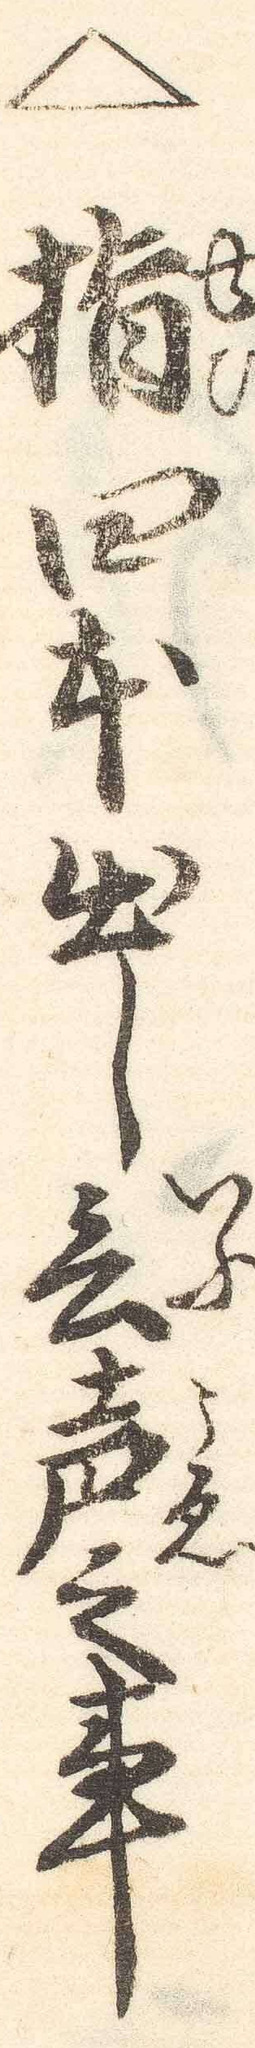△指四本出し云声之事
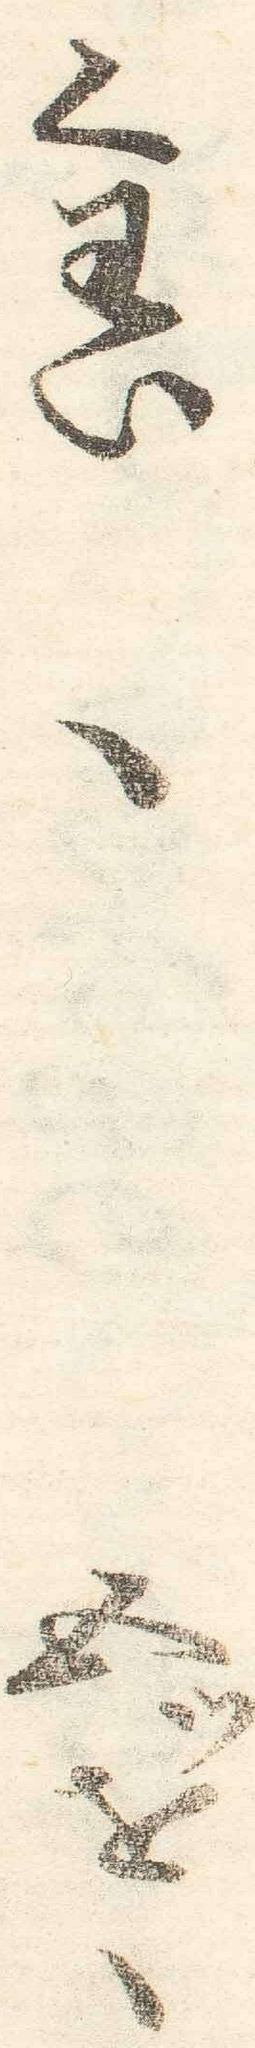くわいヽ五ッをヽ
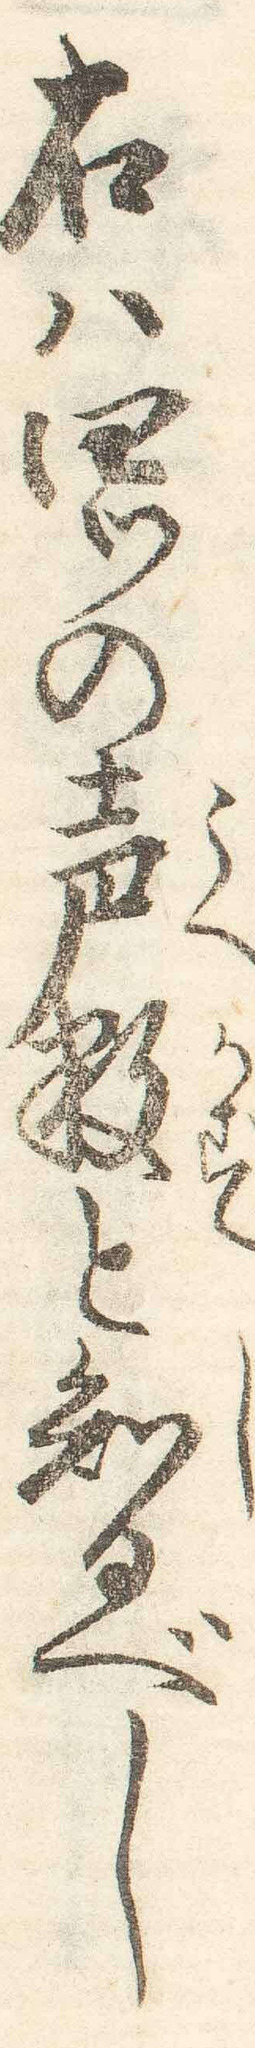右は四ッの声数と知るべし

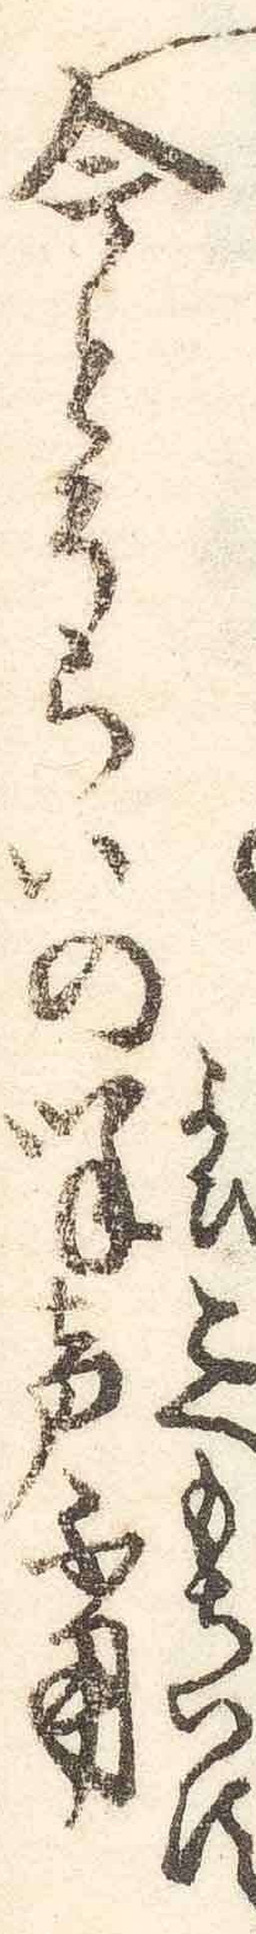今とうらいの呼声不用
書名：拳独稽古
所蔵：東京学芸大学附属図書館 国文学研究資料館
